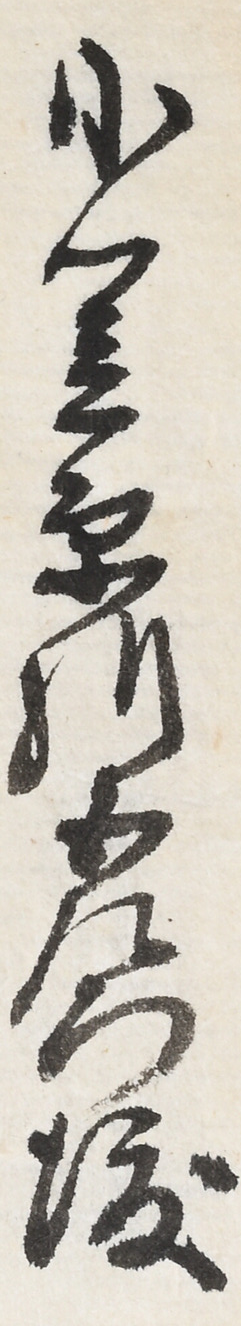小笠原折五左衛門渡
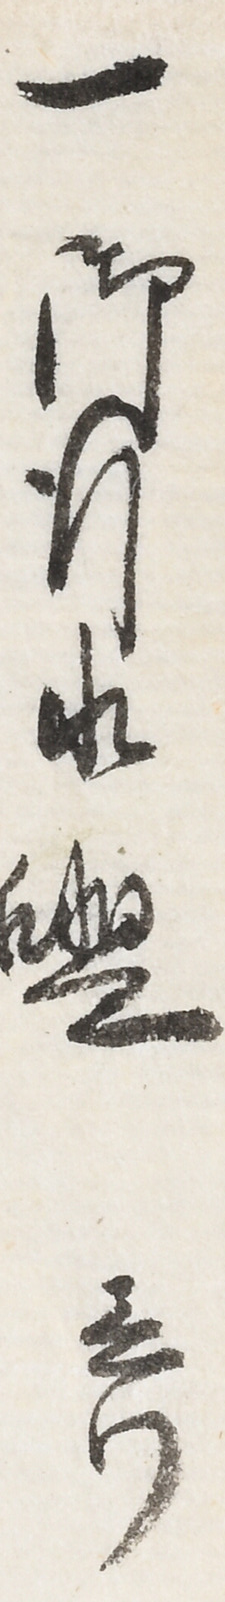一御行水盥壱ツ
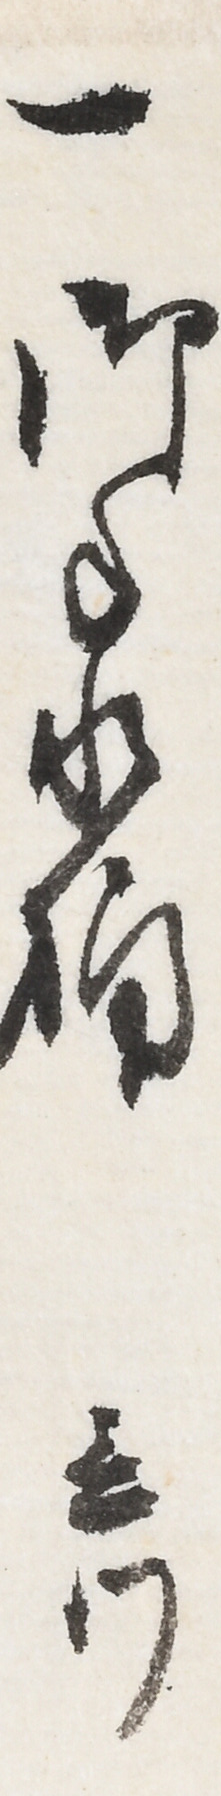一御手水桶壱ツ
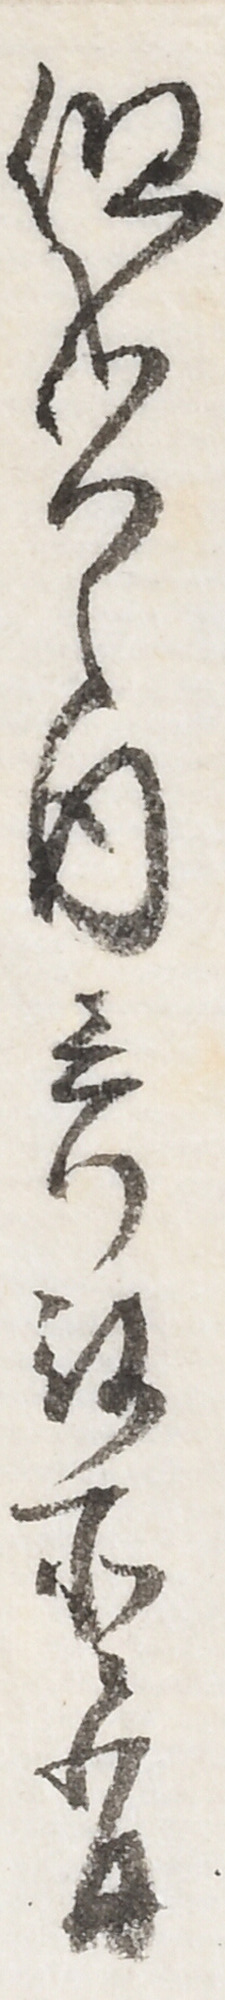但弐ツ之内壱ツ役所ニ有
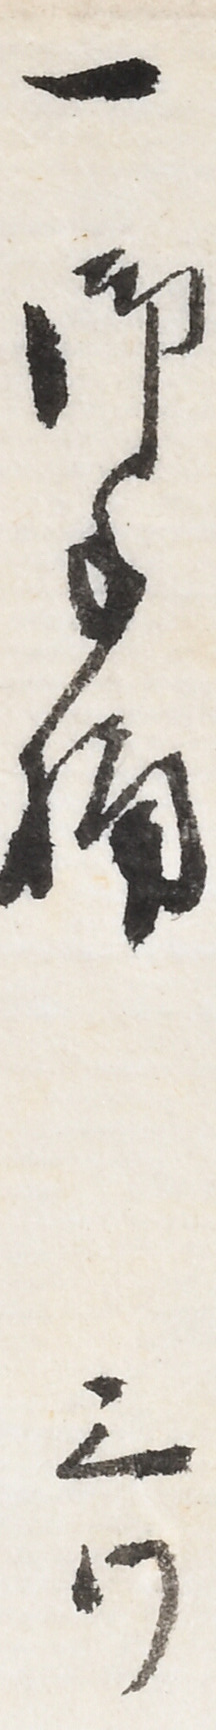一御手桶三ツ
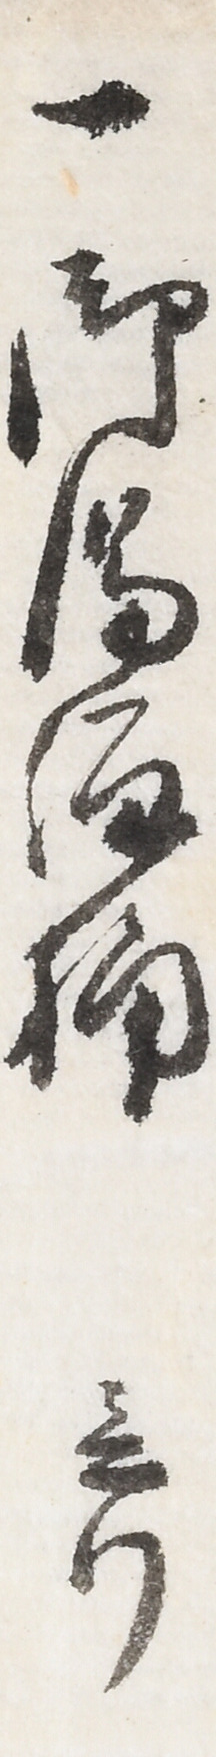一御湯溜桶壱ツ
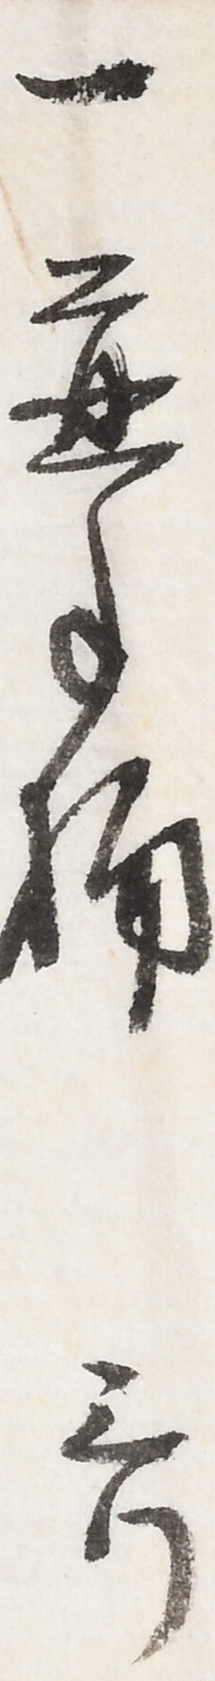一並手桶三ツ
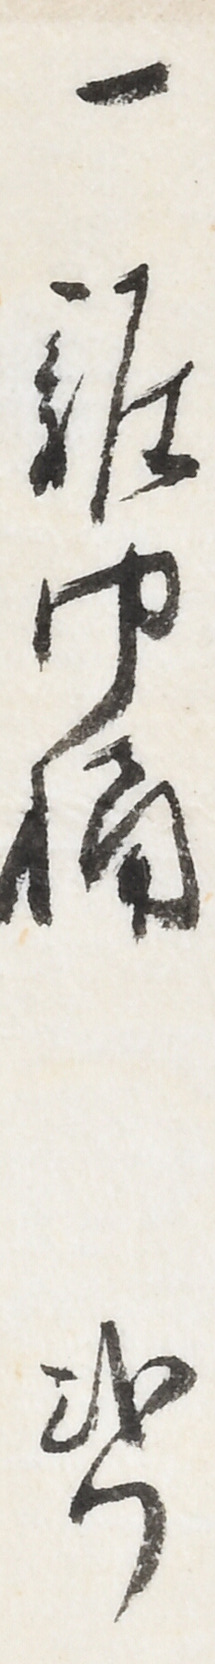一雑巾桶弐ツ
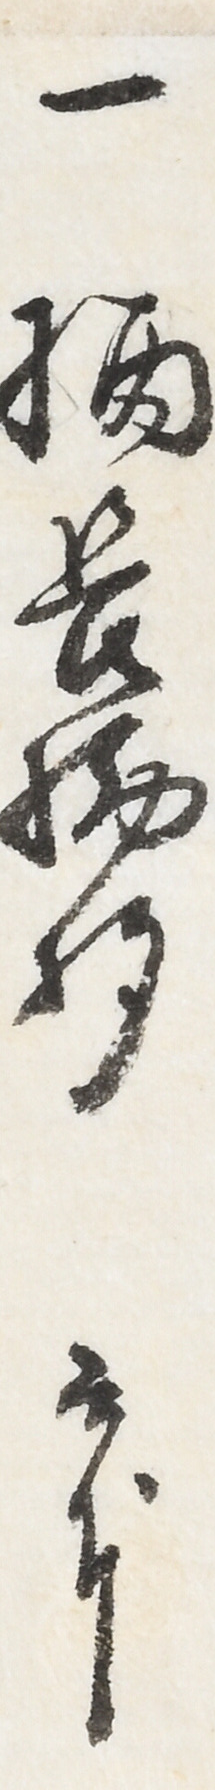一柄長柄杓弐本
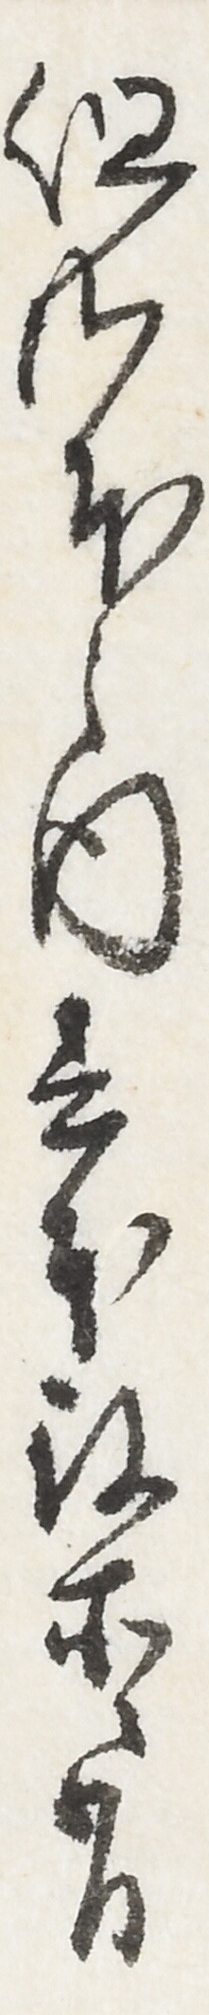但弐本之内壱本役所ニ有
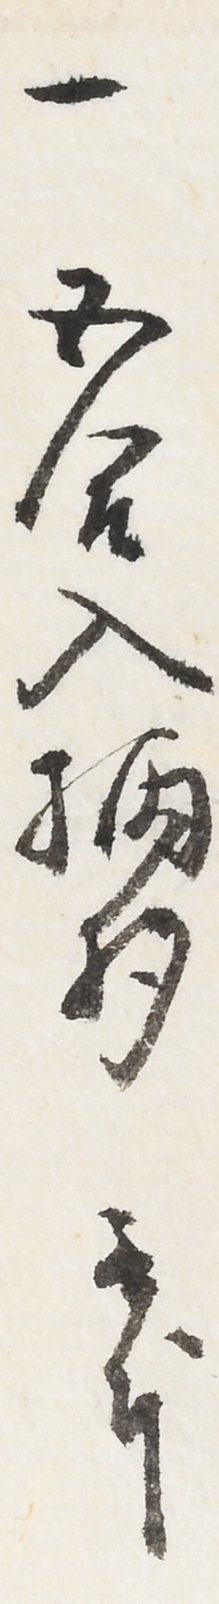一五合入柄杓弐本
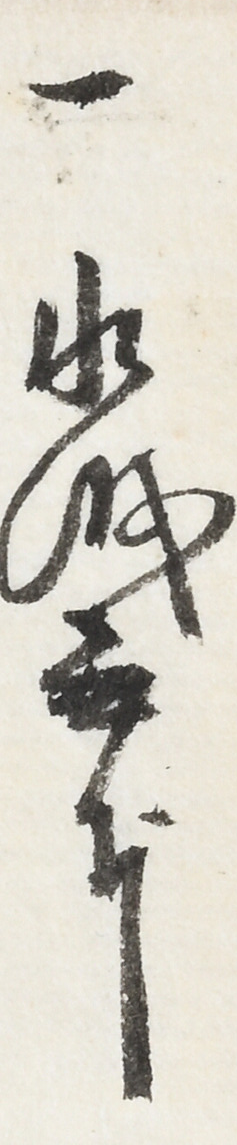一水越壱本
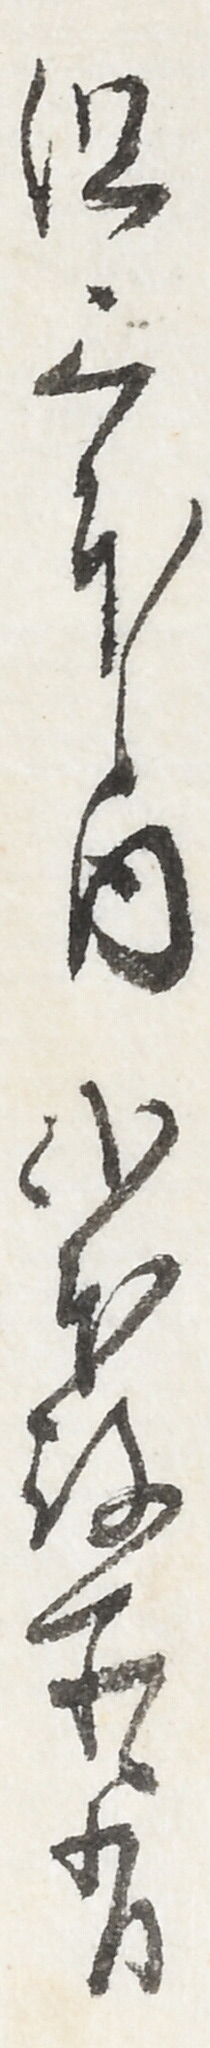但三本之内弐本役所ニ有
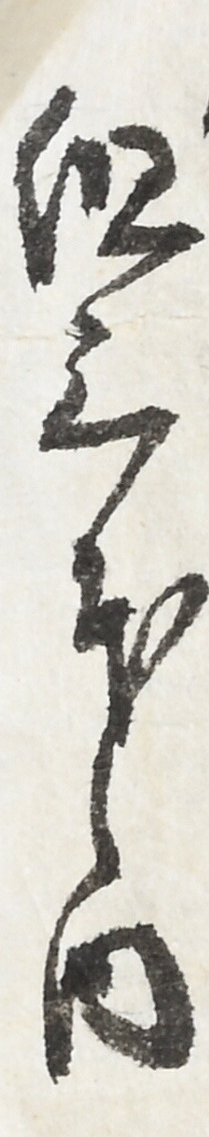但三本之内
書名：（覚）
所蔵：伊那市立高遠町図書館・合同会社AMANE
